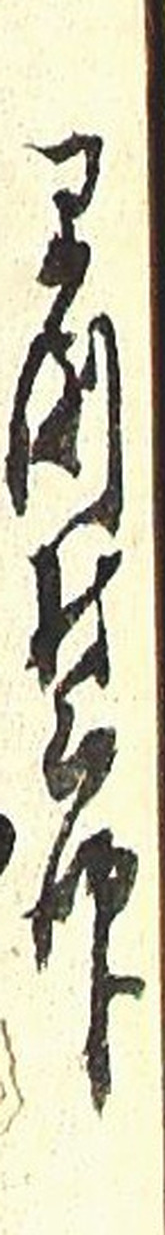早淵村玉師
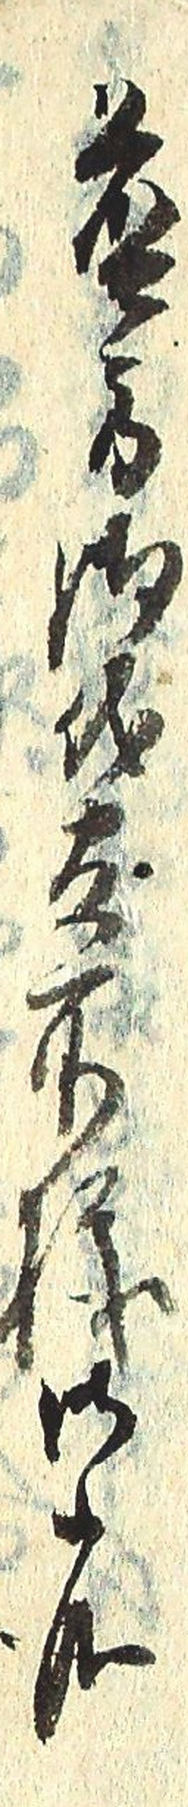藍方御代官所様御手代
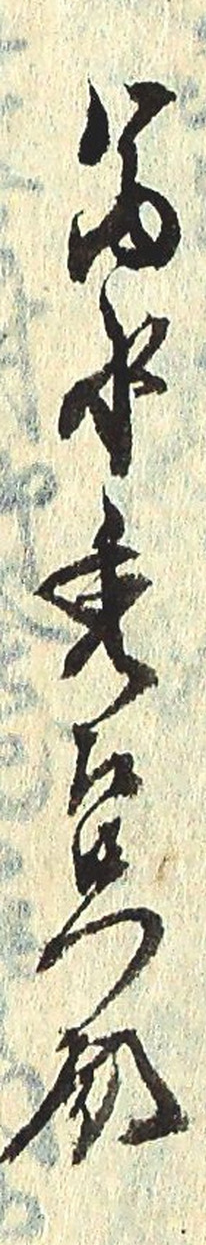富永秀左衛門殿
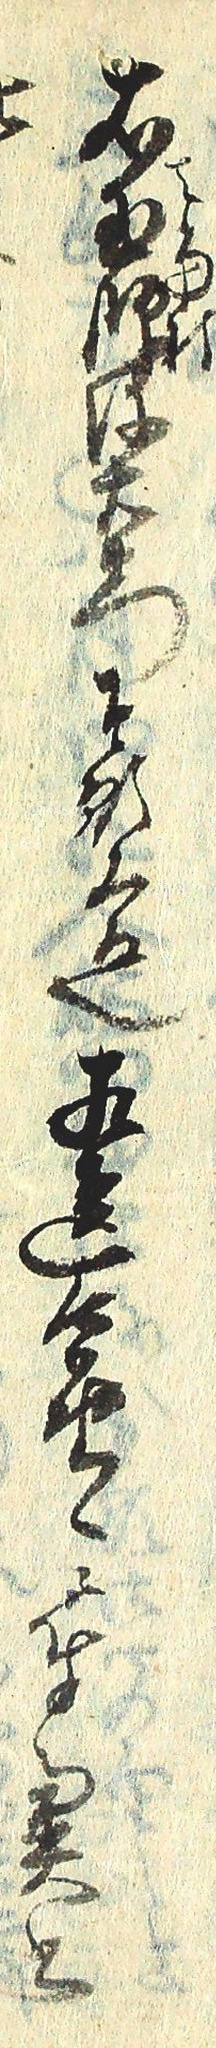右は当村玉師弥右衛門奉願上通相違無御座候に付奥書
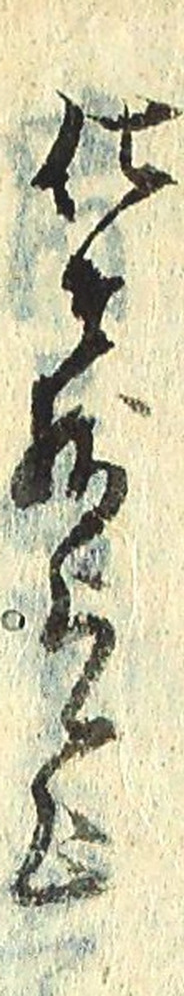仕奉指上候以上
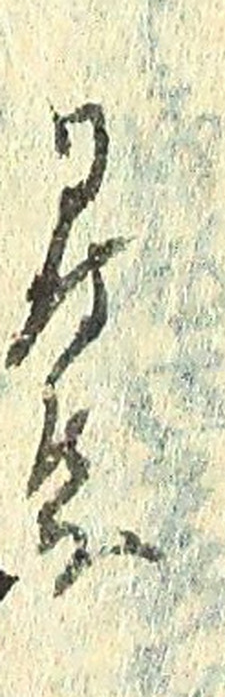同村庄屋
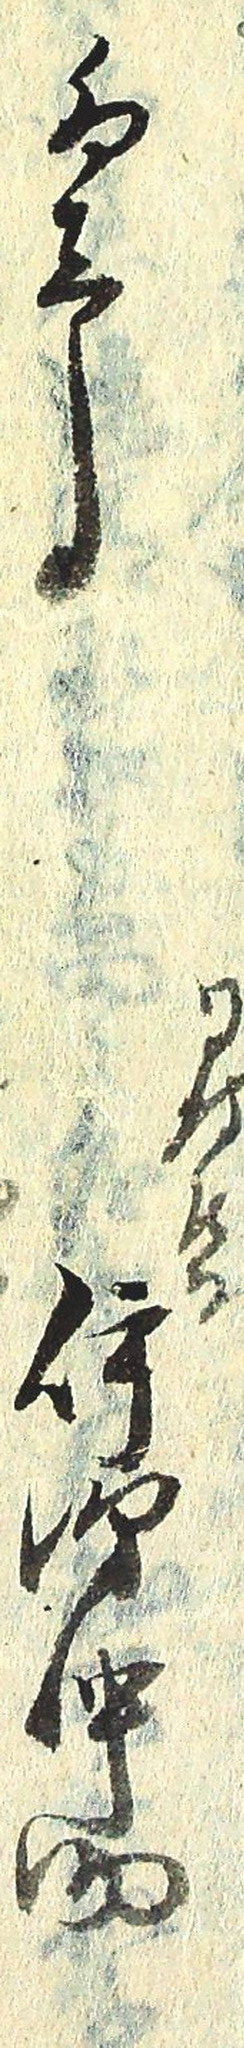卯十二月伊沢仲助
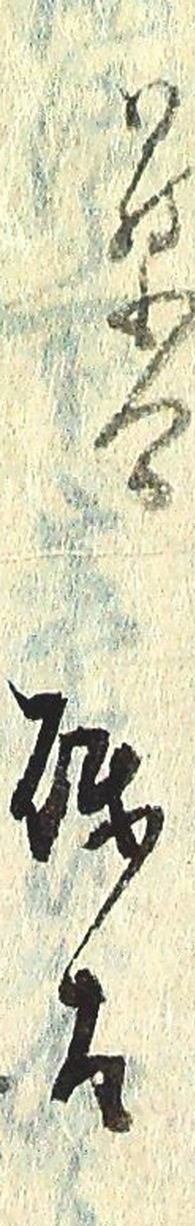同村五人与磯太
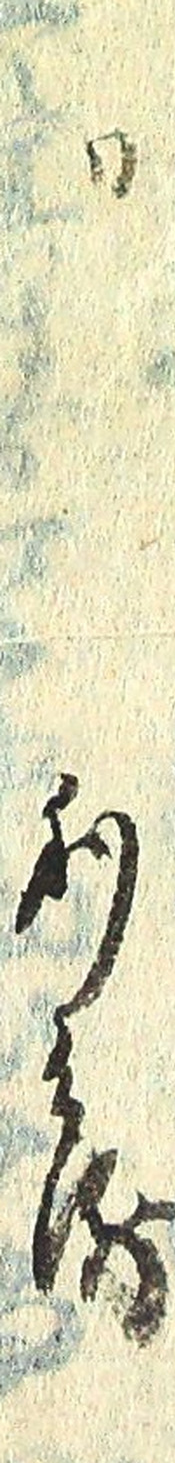同利兵衛
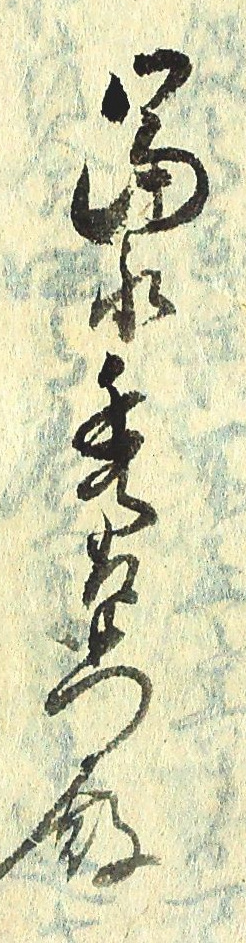富永秀左衛門殿

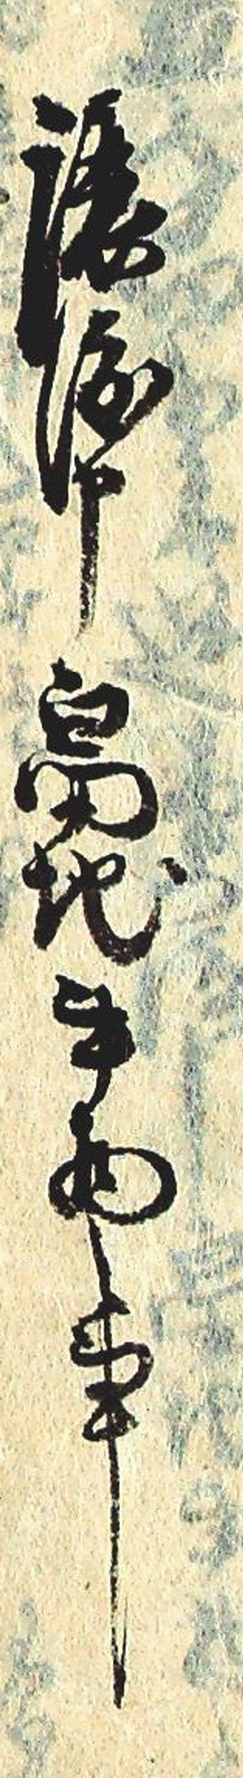譲渡申畠地書物之事
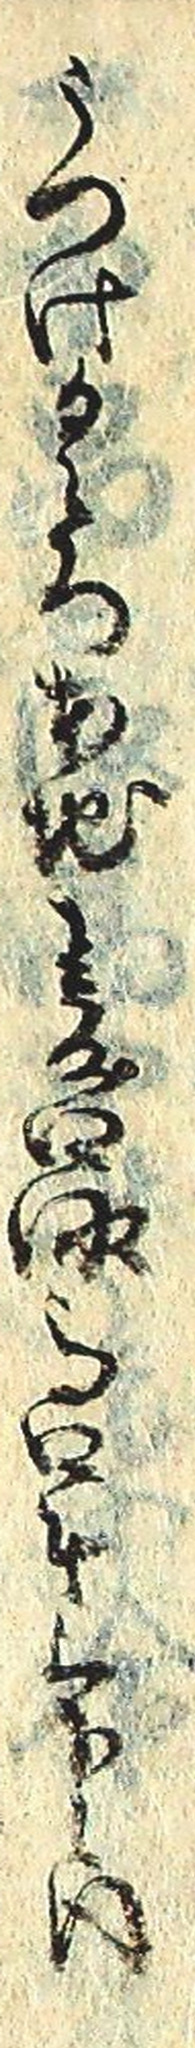うつけくろ本地壱反四畝高四斗三升之内
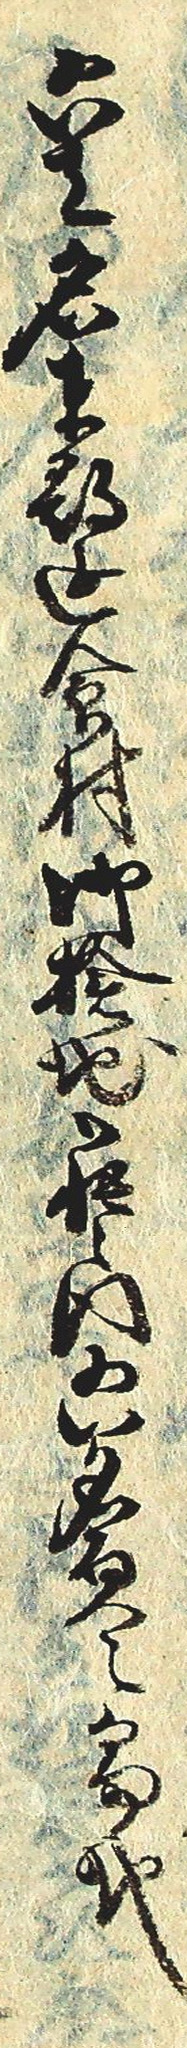右は名東郡延命村御検地御帳之内右名負之畠地
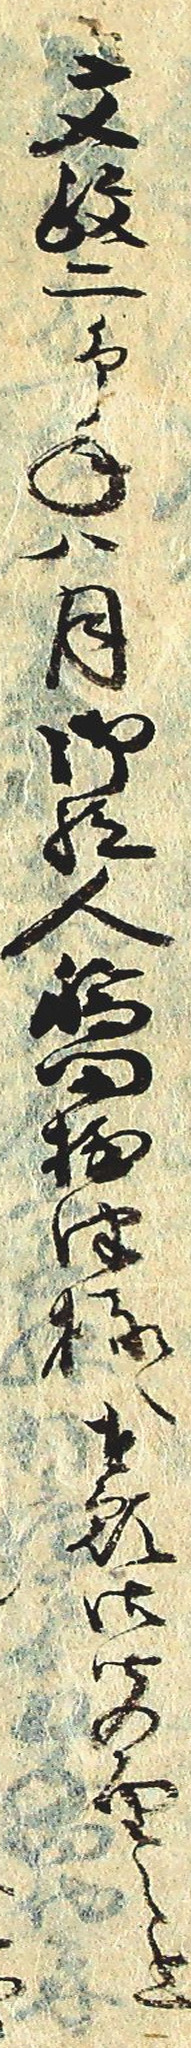文政二卯年八月御給人稲田摂津様へ奉願御聞届之上
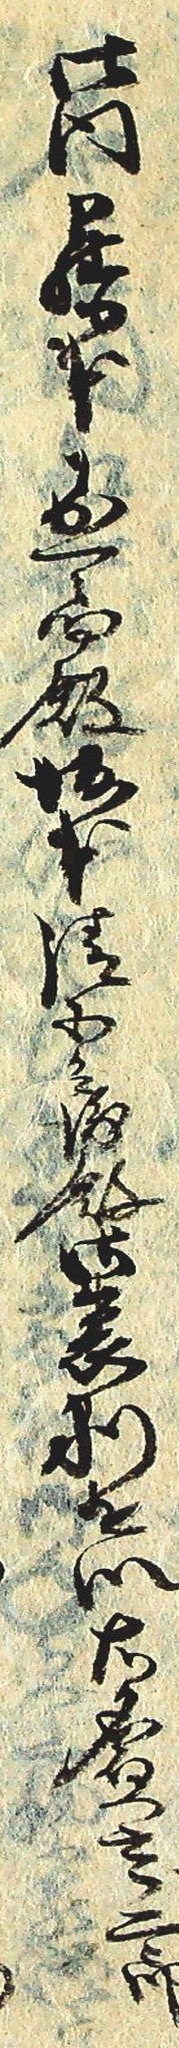御内藤本嘉一郎殿坂本清五兵衛殿御裏判を以右名負六郎二郎
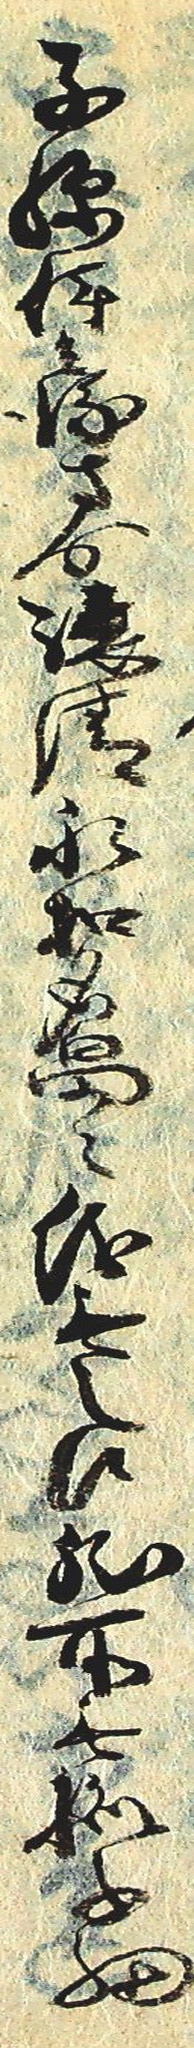子孫伊兵衛方ゟ譲請私扣名畠に紛無之候然所無拠子細
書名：諸御願書控(弐番）
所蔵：鳴門教育大学 Naruto University of Education
